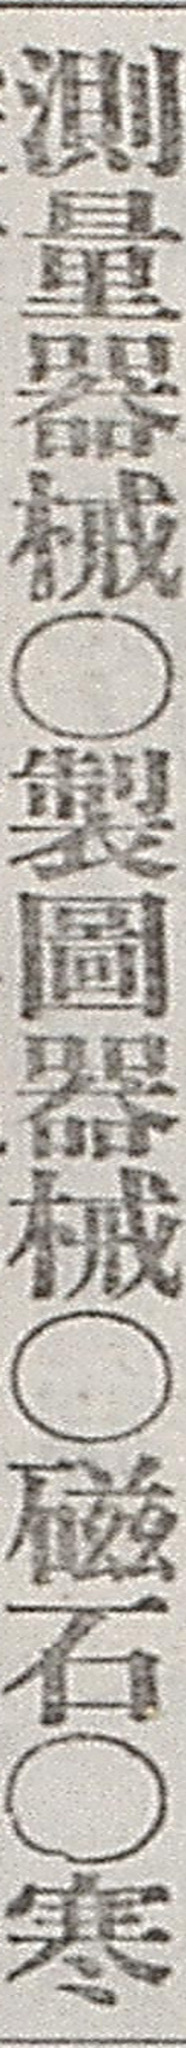測量器械〇製図機械〇磁石〇寒
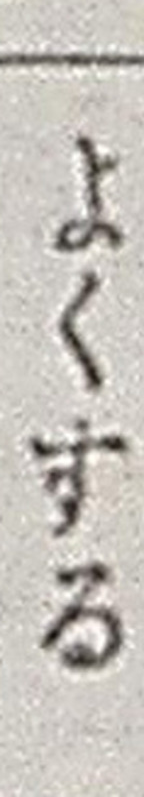よくする
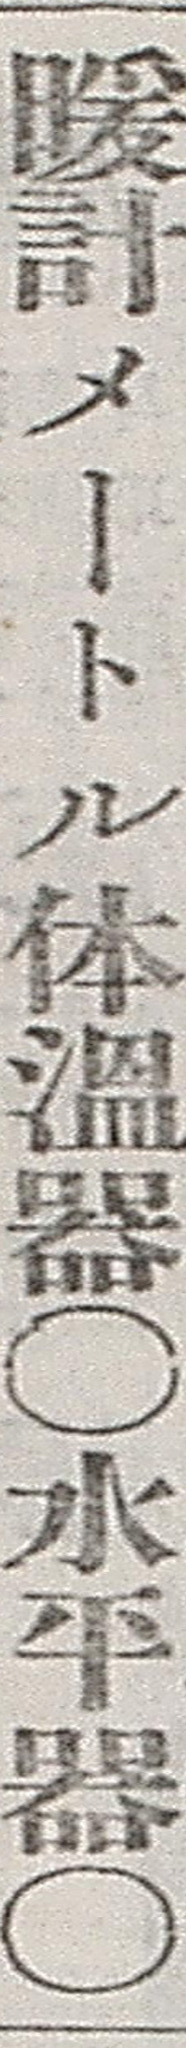暖計メートル体温器〇水平器〇
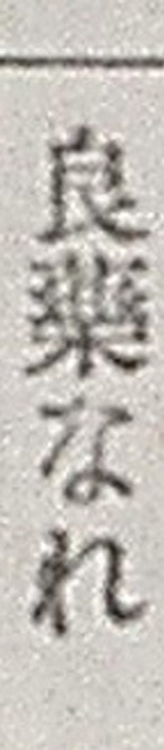良薬なれ
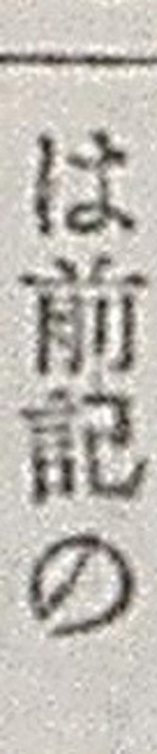は前記の
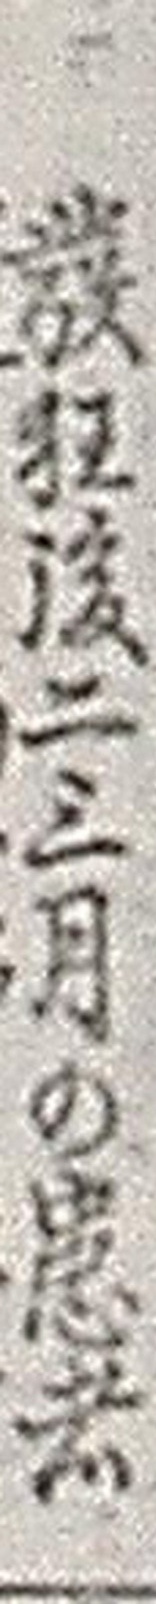厳狂後二三月の患者
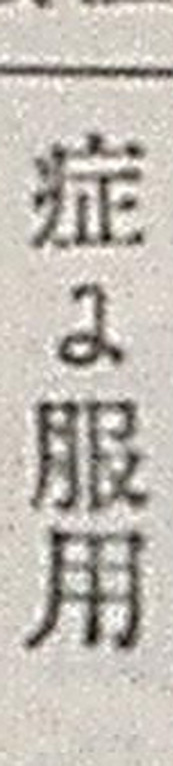症に服用
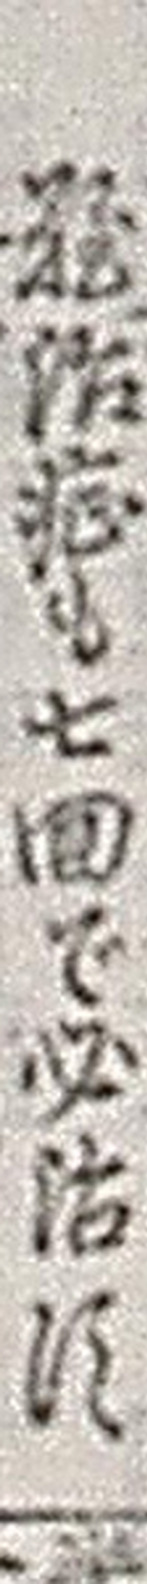難治症も七回で必治す
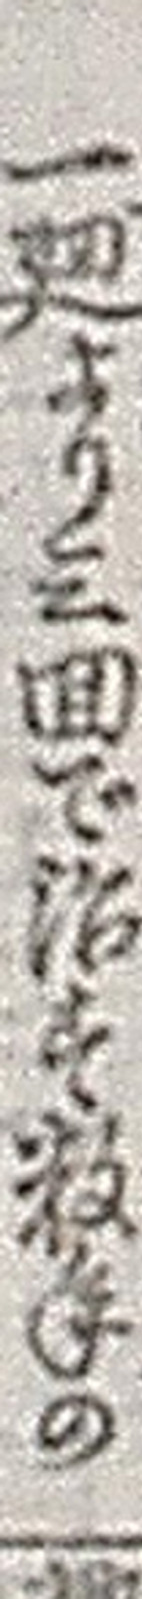一廻より三回で治す数年の
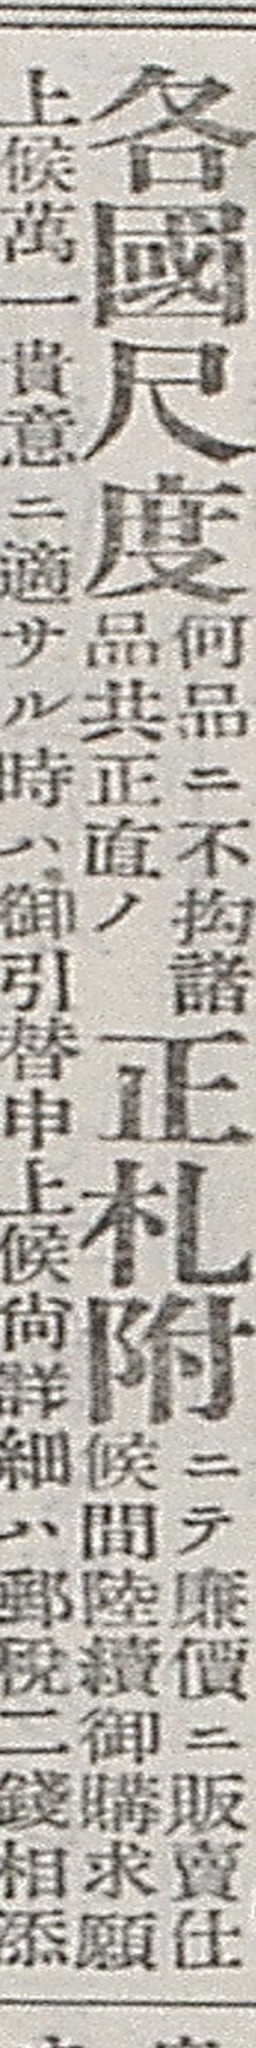上候万一貴意ニ適サル時ハ御引替申上候尚詳細ハ郵税二銭相添
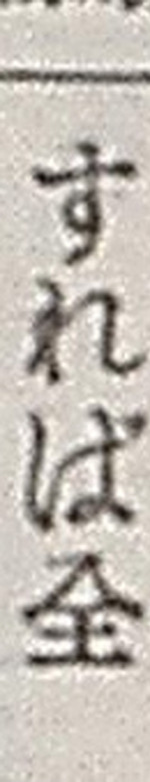すれば全
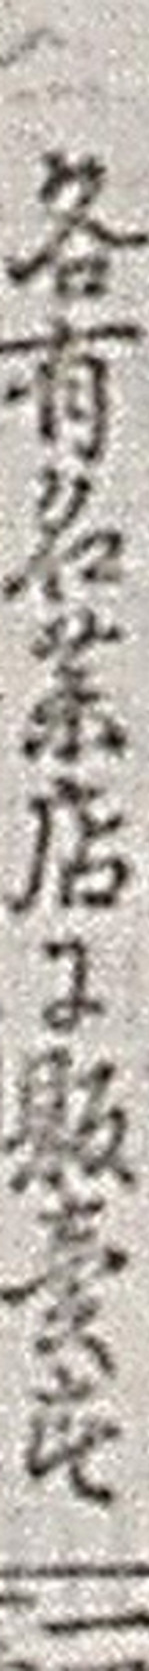各有名薬店に販売す
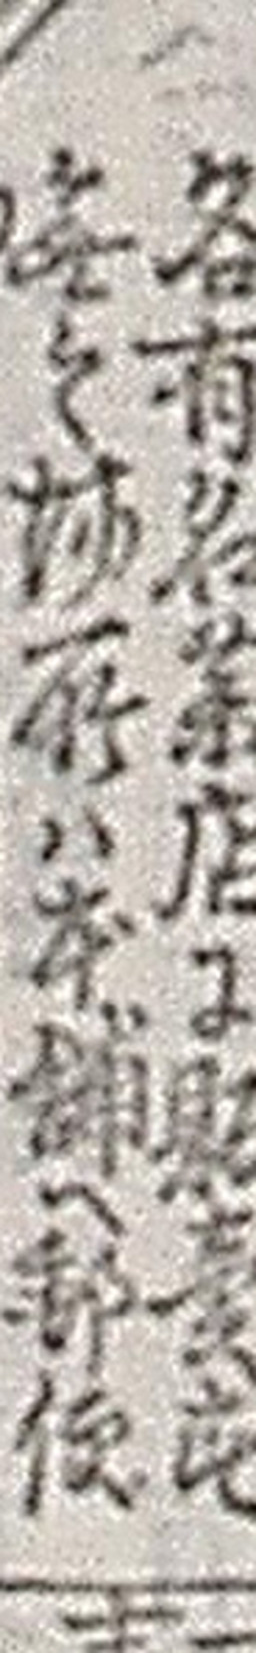無之場所ハ本舗へ郵便
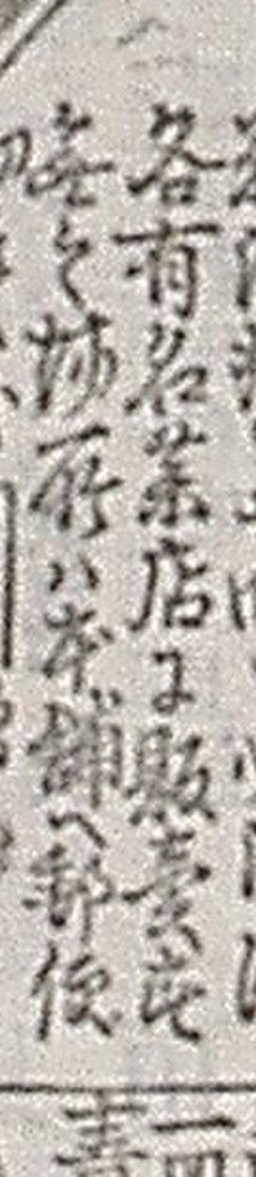無之場所ハ本舗へ郵便
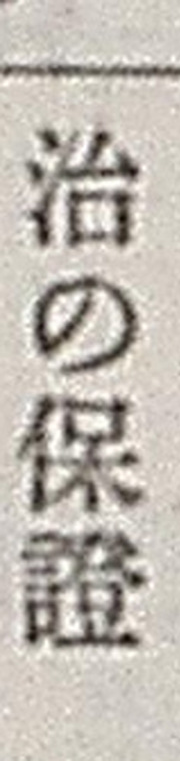治の保証
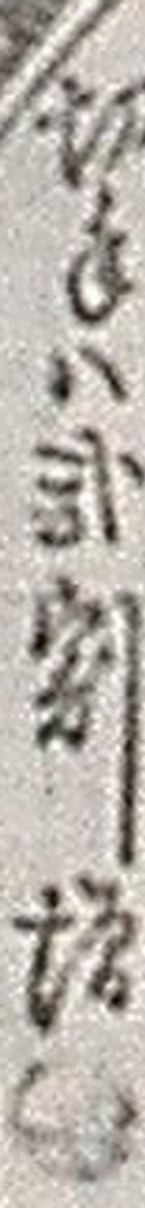切手ハ弐割増
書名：風俗畫報臨時増刊第百二十號　大海嘯被害録（下）
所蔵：東京大学地震研究所図書室 Earthquake Research Institute Library, The University of Tokyo, JAPAN
